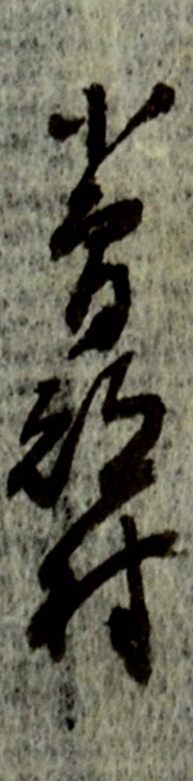小曽部村

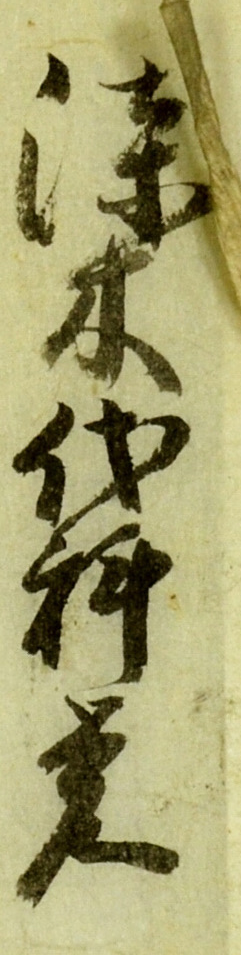漆木代料覚
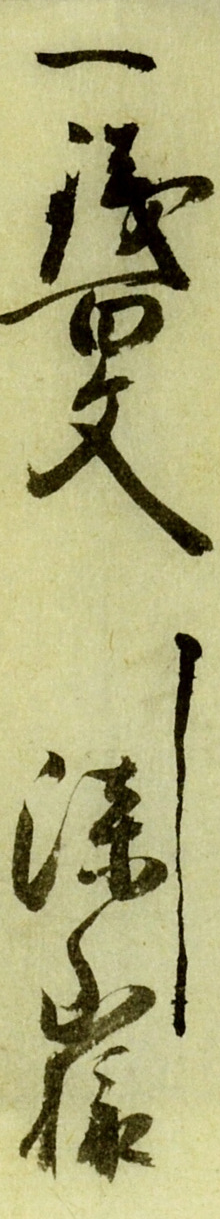一銭百文漆山様
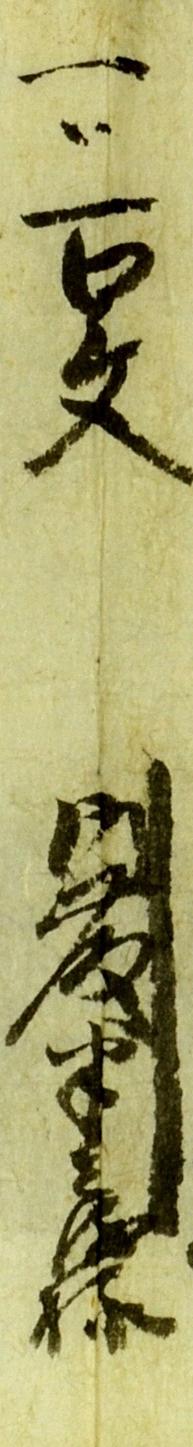一同百文内藤半兵衛様
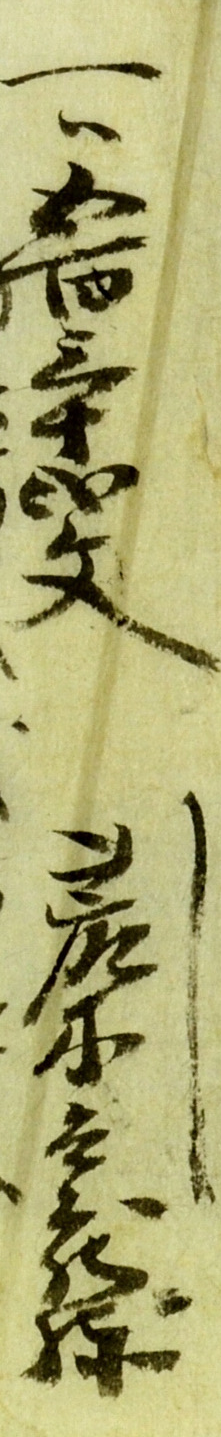一同五百三十弐文荒木兵蔵様
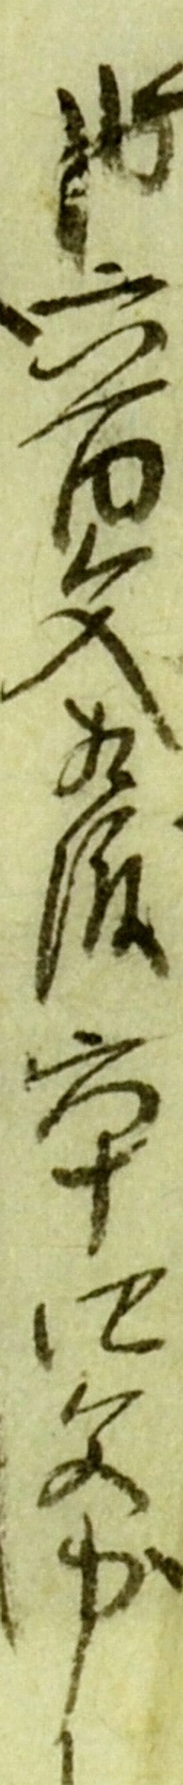内六百文相渡六十四文かし
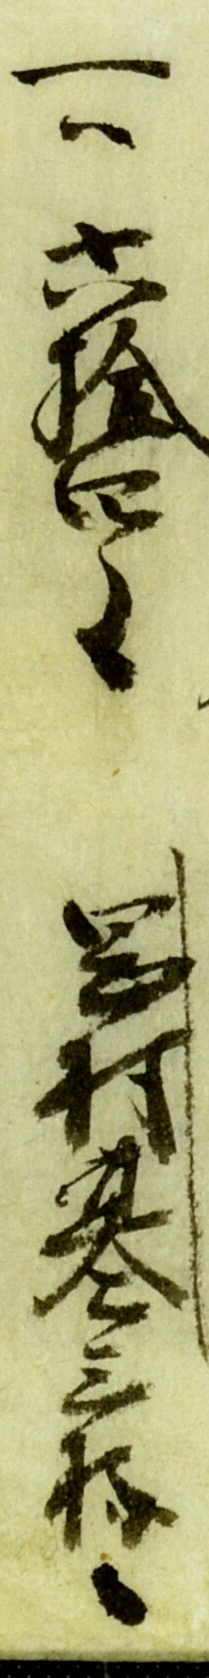一同六拾四文岡村基三様
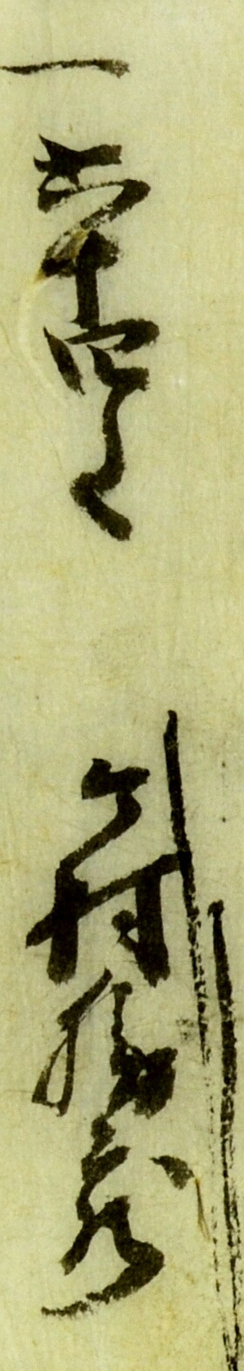一六十四文今村勝蔵

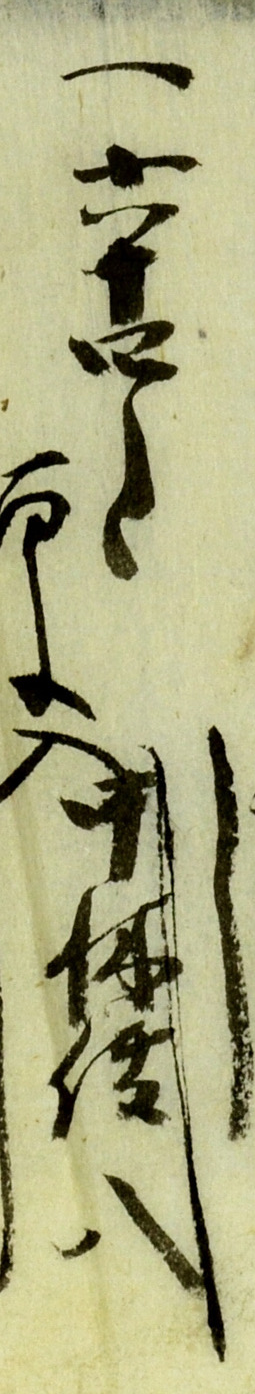一六十四文中林俊八
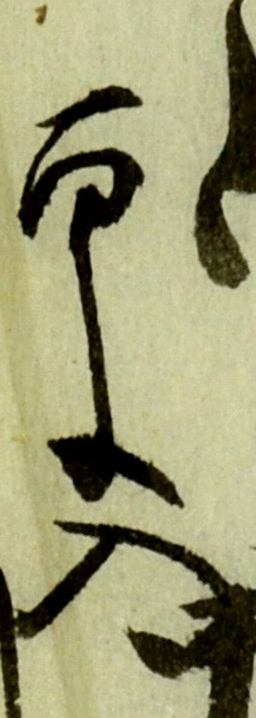百文入
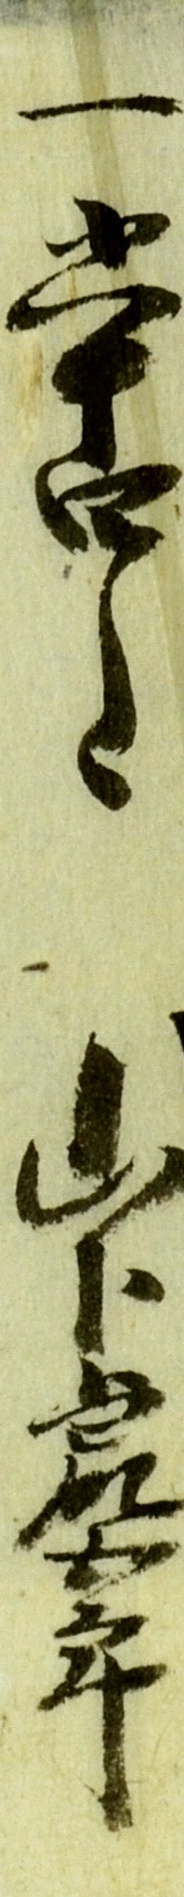一六十四文山下虎五郎
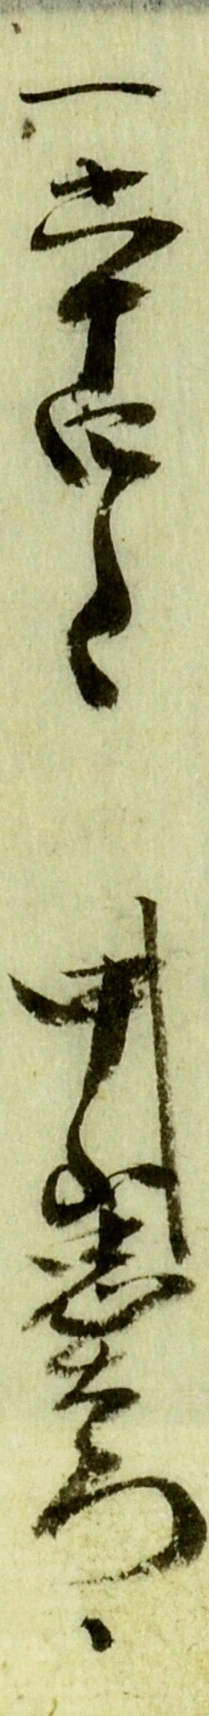一六十四文中山忠右衛門
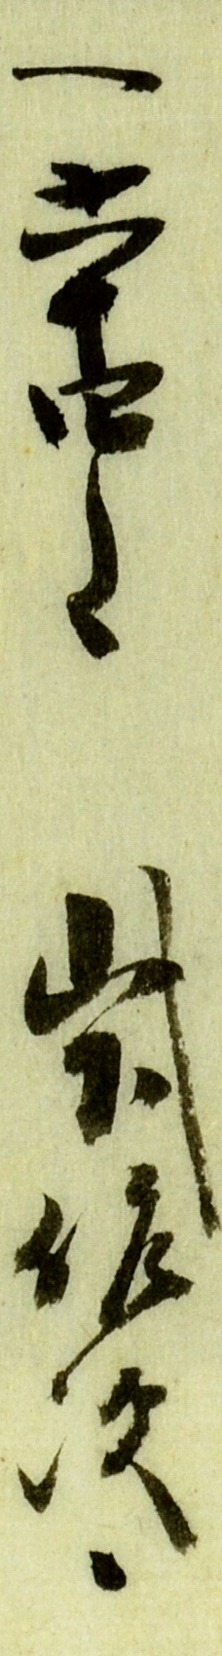一六十四文山下佐次
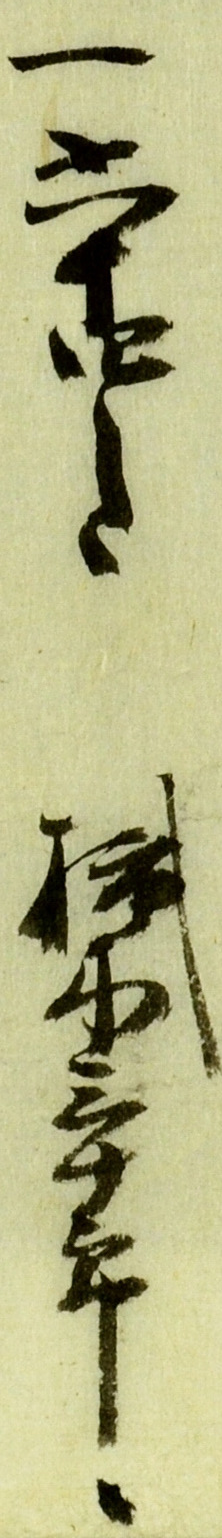一六十四文柿木三十郎
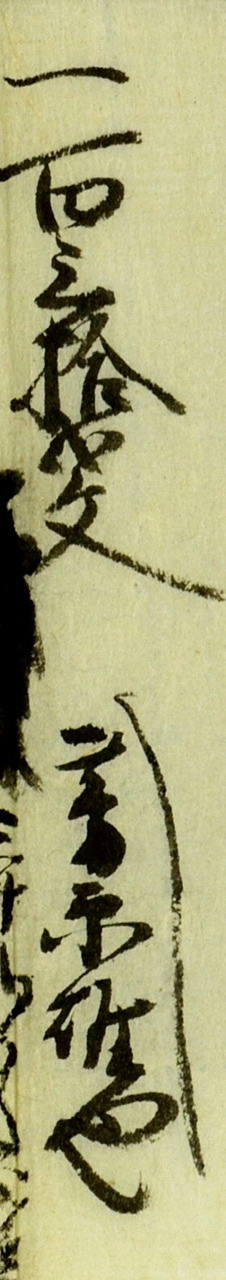一百三拾弐文茅原雄也
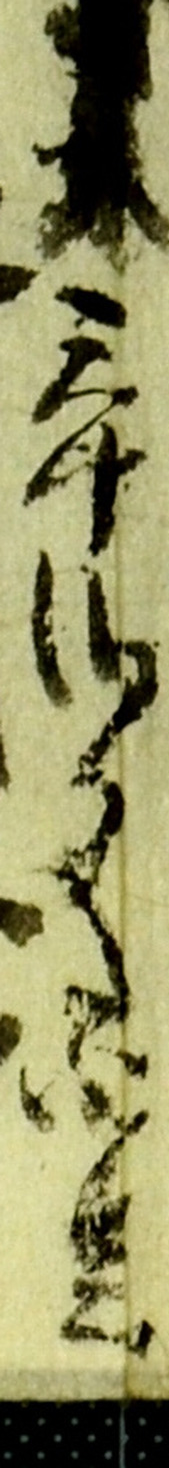三十弐文不足
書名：覚
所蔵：伊那市立高遠町図書館・合同会社AMANE
